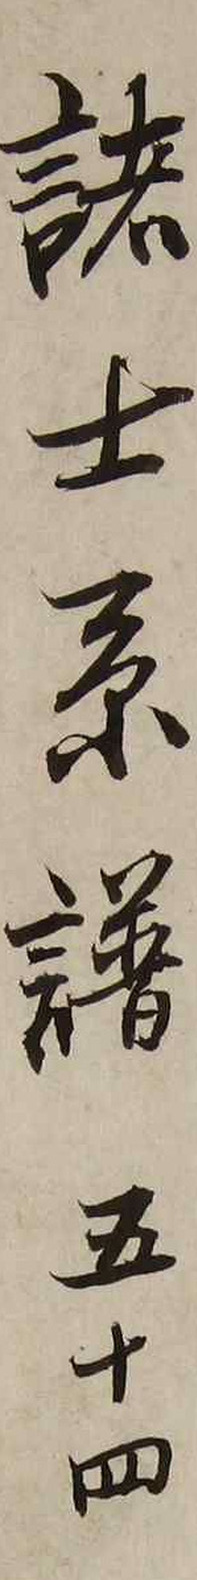諸士系譜五十四

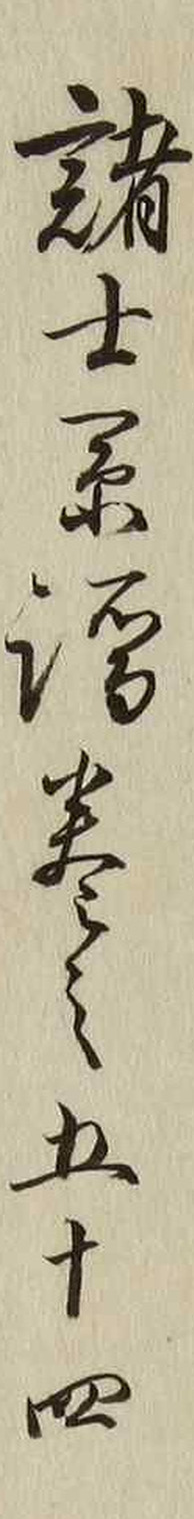諸士系譜参之五十四
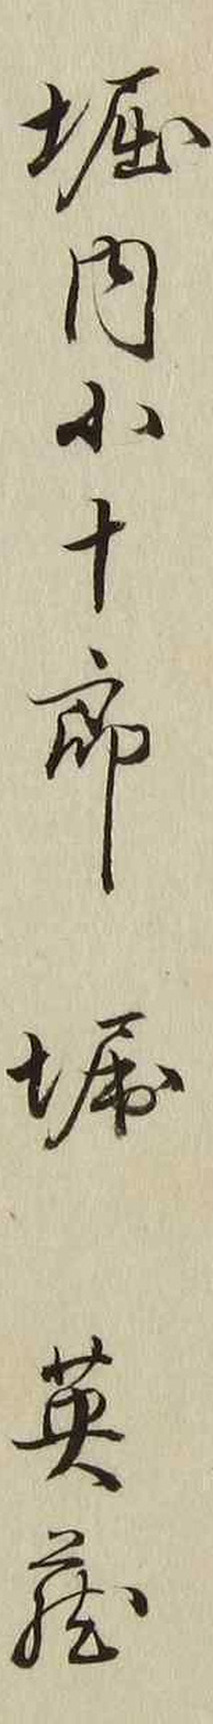堀内小十郎堀英蔵
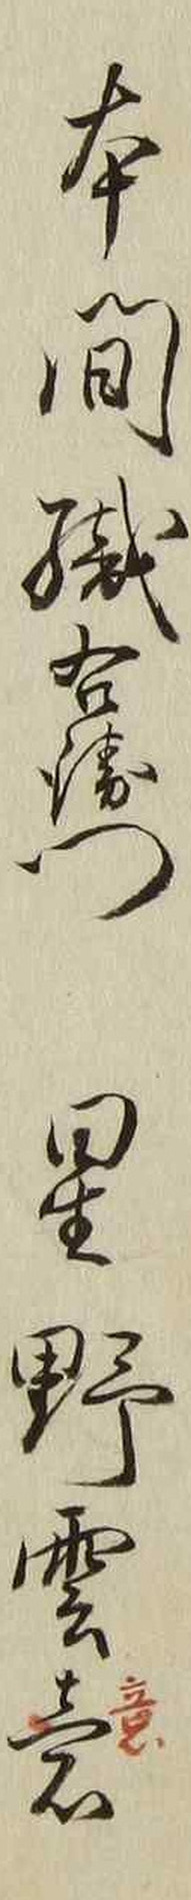本間職右衛門星野雲意
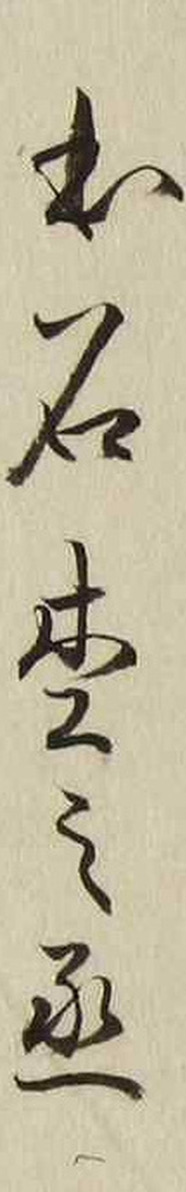本名杢之丞

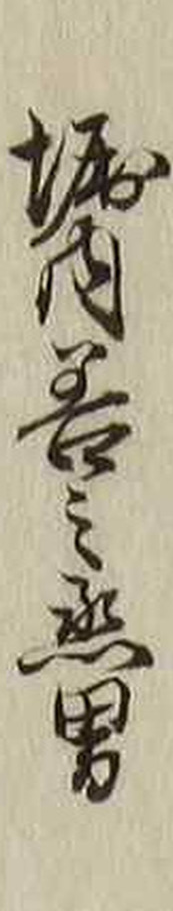堀内善之丞男
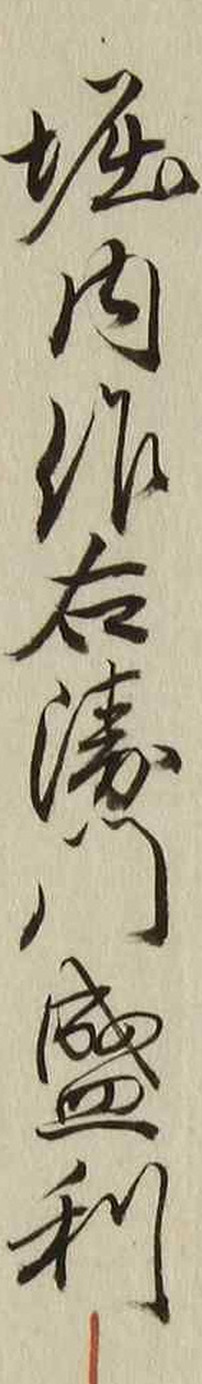堀内作右衛門盛利
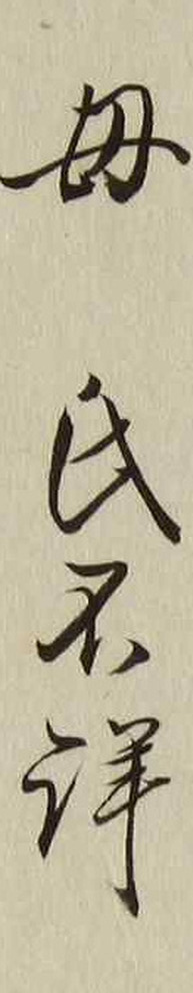母氏不詳
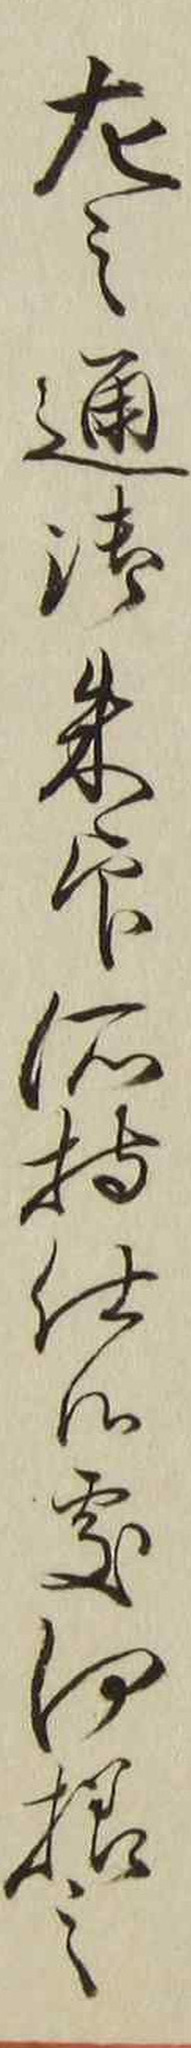左之通御朱印所持四仕候処何様之
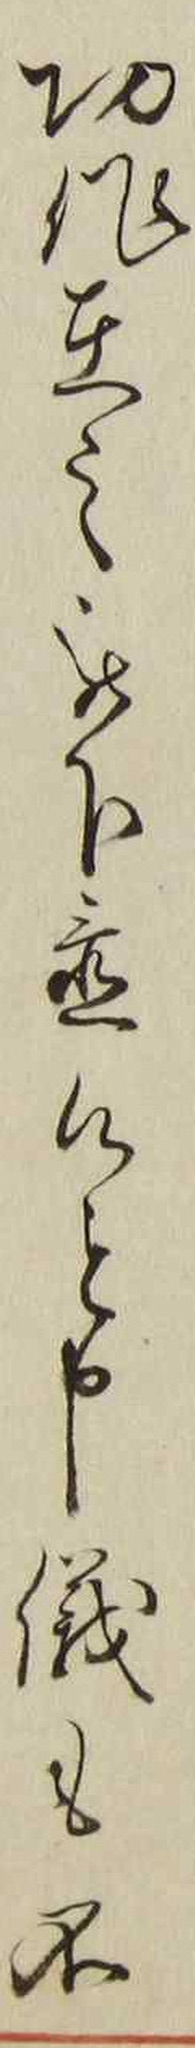功作在之被下置候と申儀も不

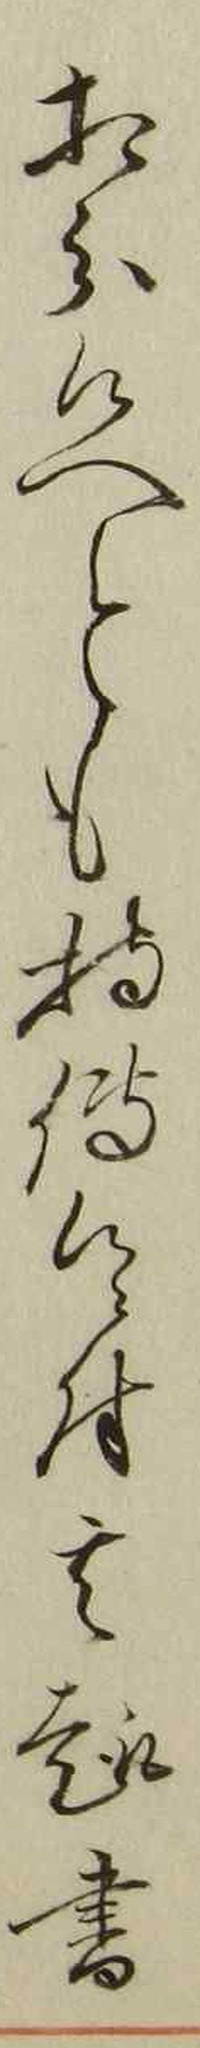相分そ候へとも持伝候ニ付其趣書
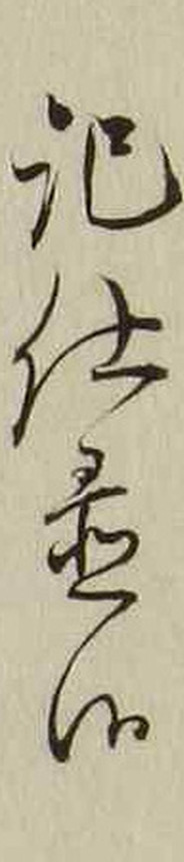記仕置候
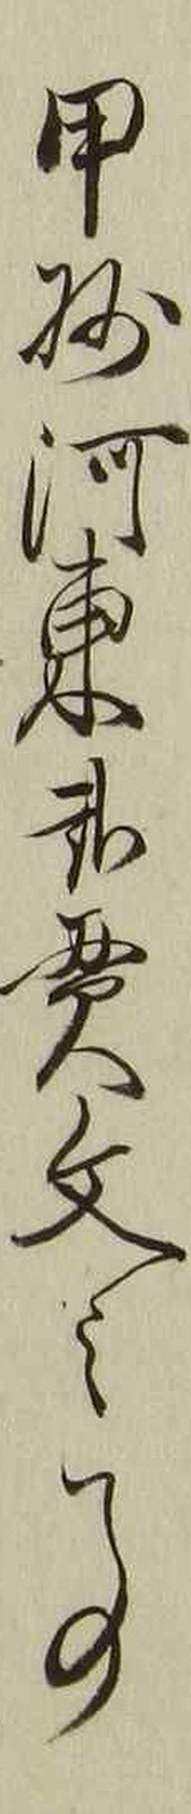甲州河東弐貫文之事
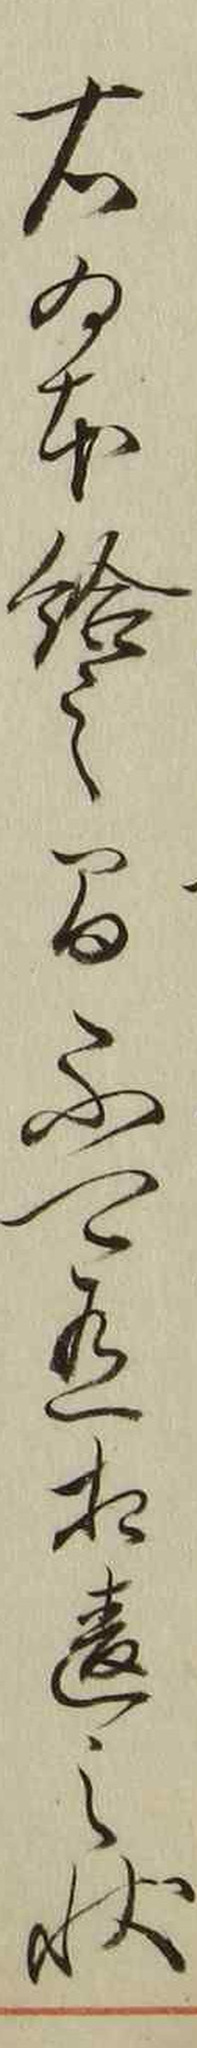右為本給之間不可有相違之状
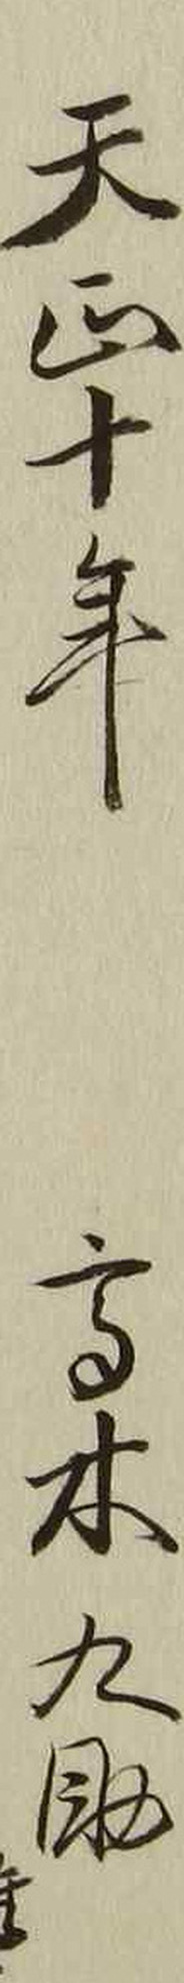天正十年高木九助
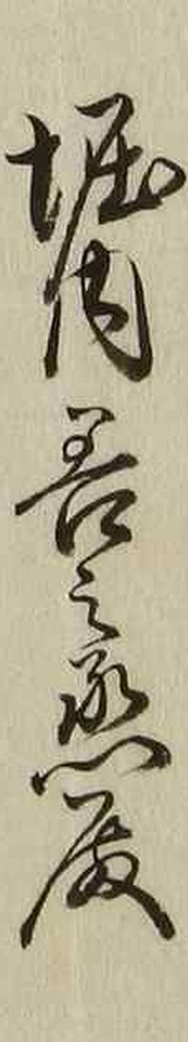堀内善之丞殿
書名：諸士系譜　巻之54　ほ之部1
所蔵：会津若松市立会津図書館
